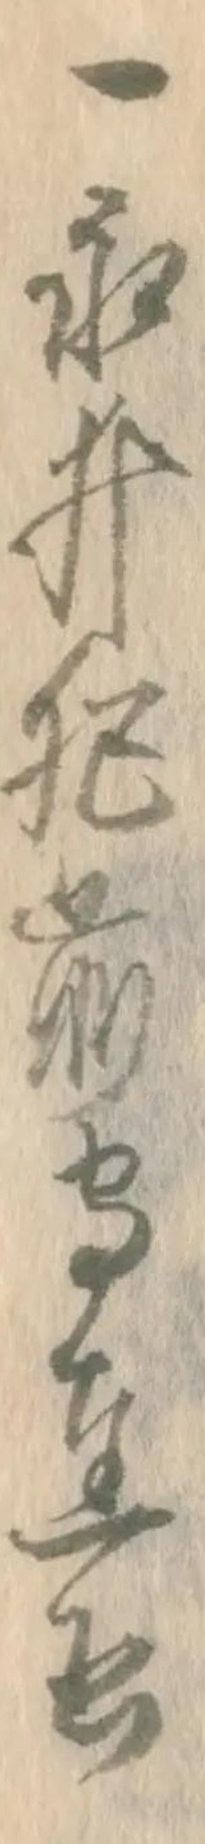一永井肥前守達書
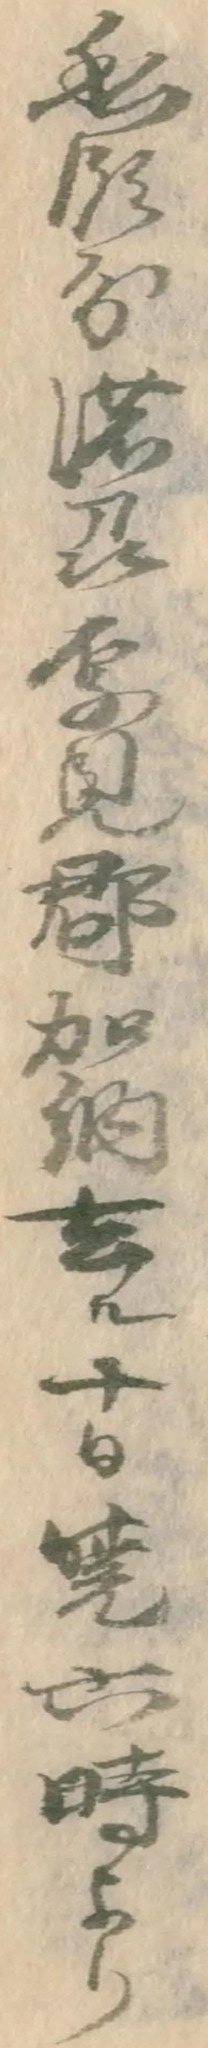私領分濃州石見郡加納去十日暁六時より

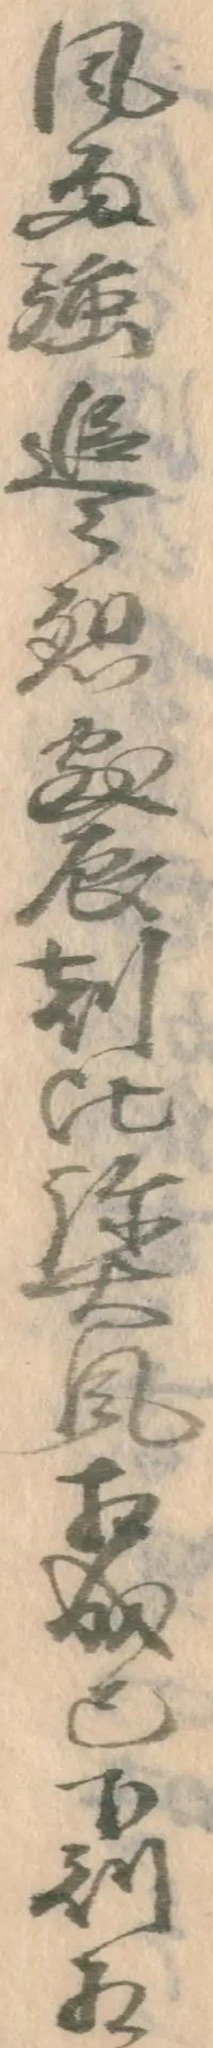風雨強追々烈敷辰刻比弥大風相成巳下刻相
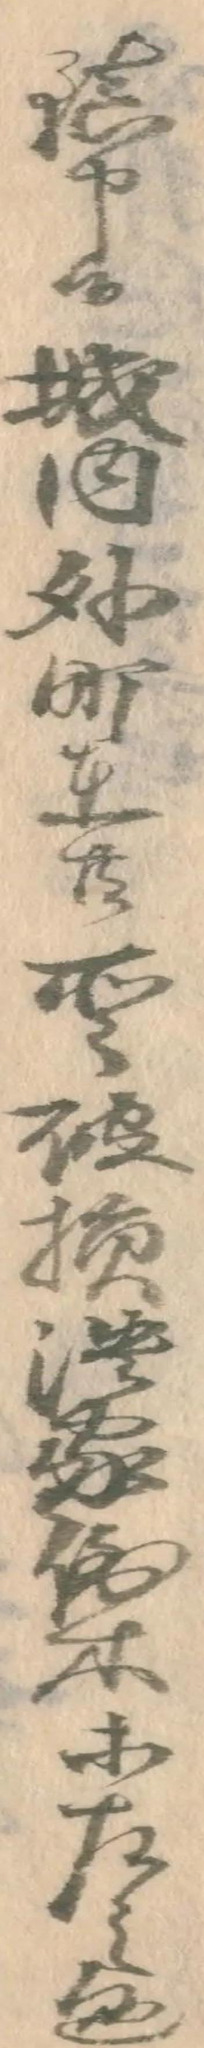鎮申候城内外町在共所々破損潰家倒木等左之通
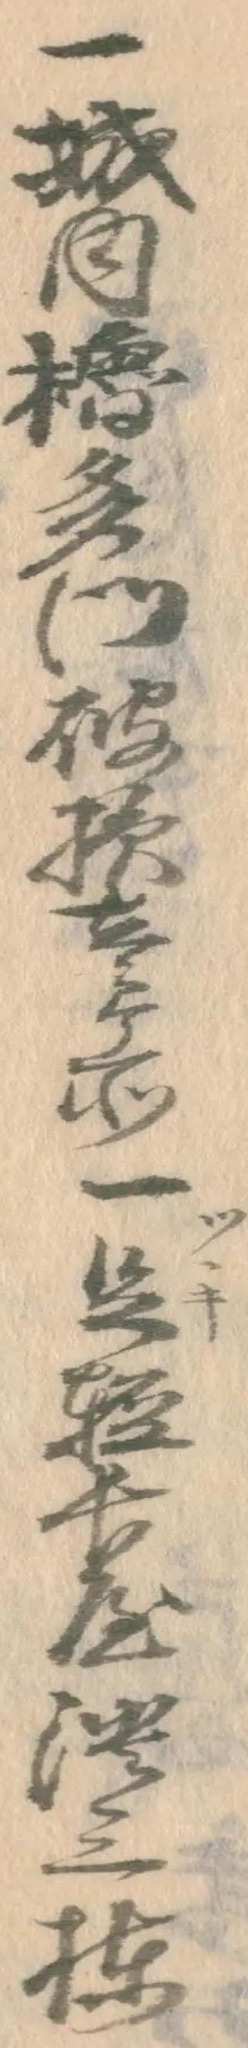一城内櫓多門破損壱ヶ所一足軽長屋潰三棟
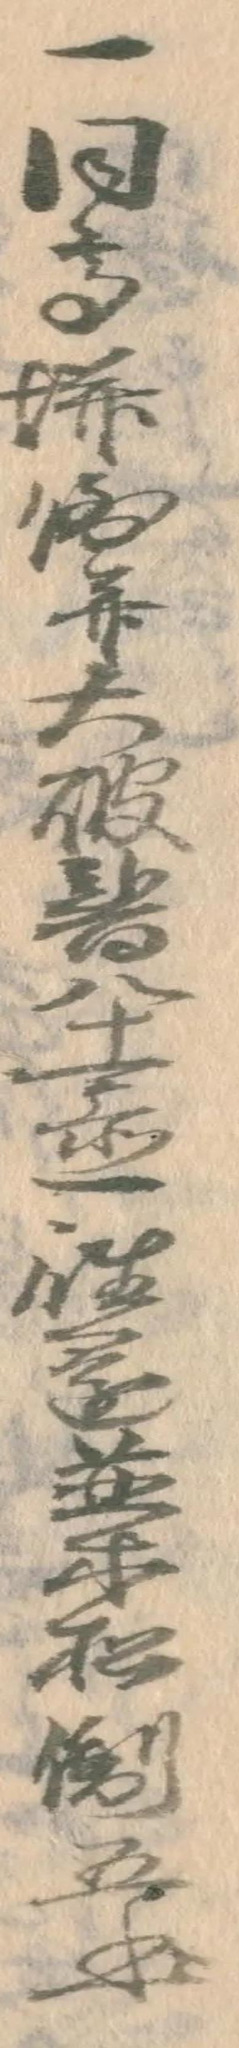一同高塀倒并大破弐百八十一ヶ所一往還並木松倒五本
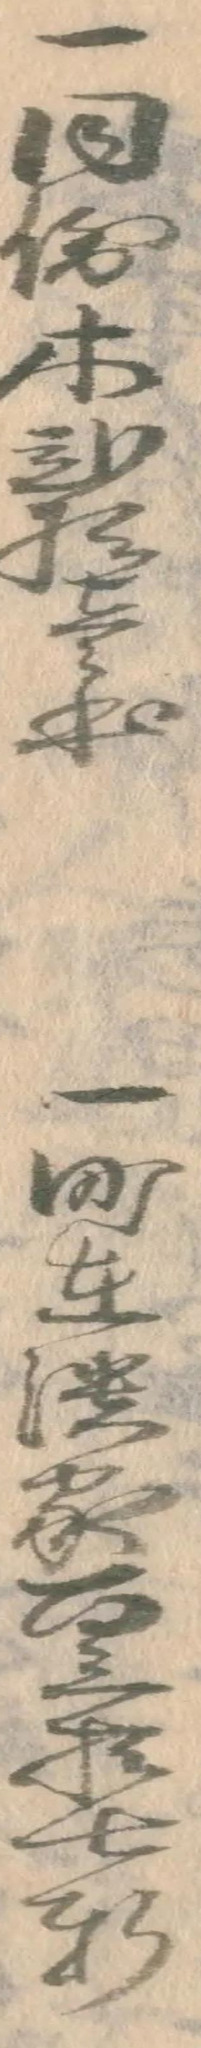一同倒木弐拾壱本一町在潰家百三拾七軒
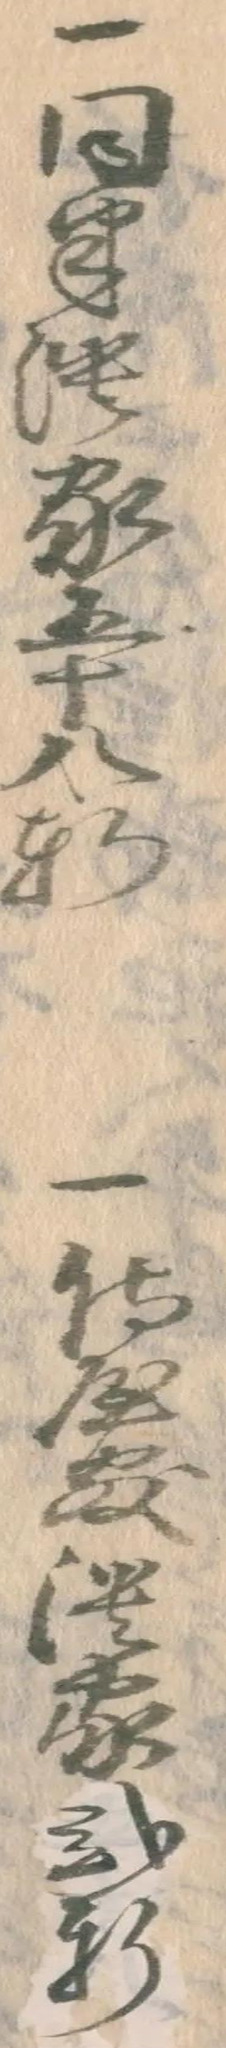一同半潰家五十八軒一侍屋敷潰家弐軒
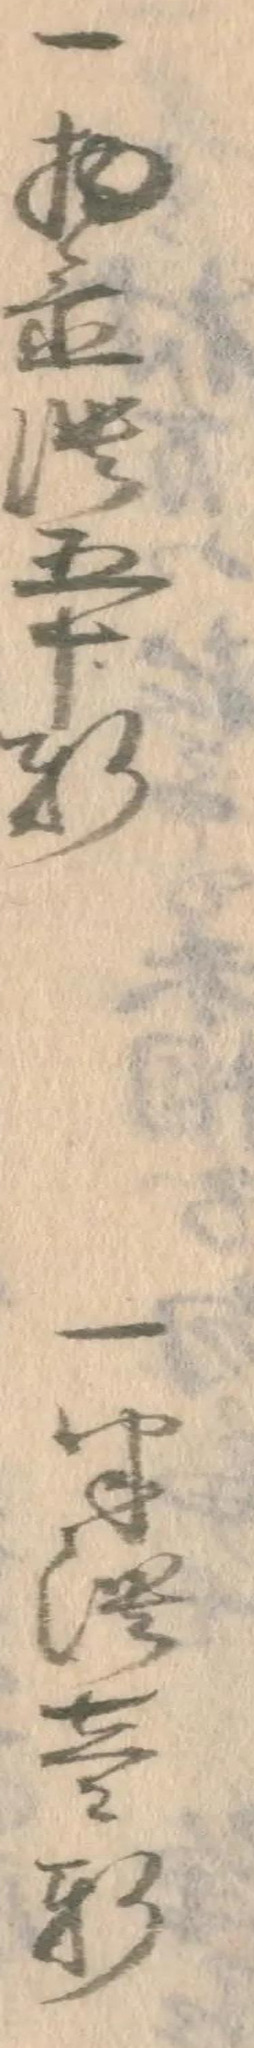一物置潰五十軒一半潰壱軒
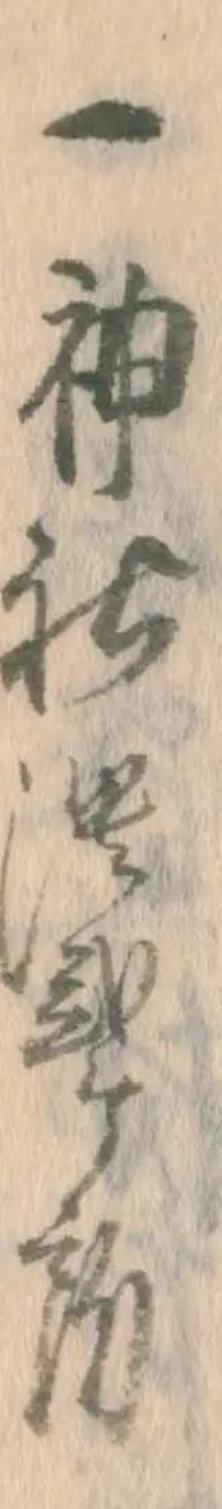一稲荷社潰壱ヶ所
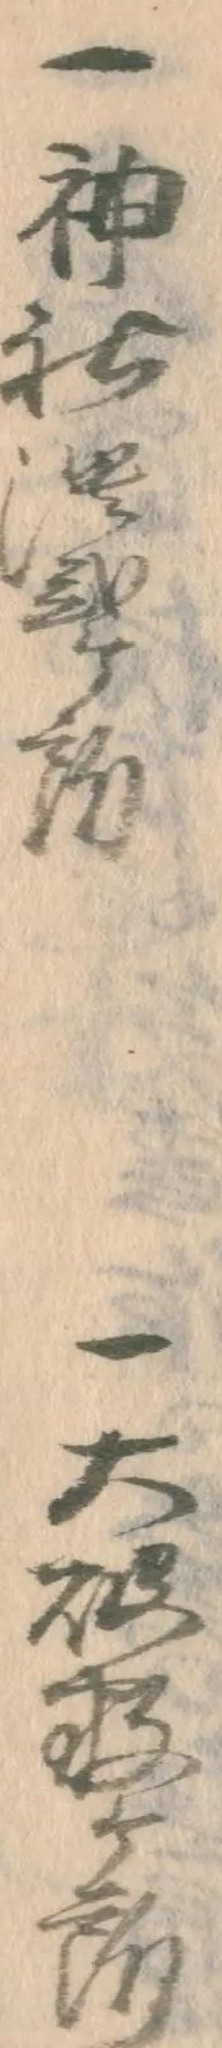一神社潰弐ヶ所一大破数ヶ所
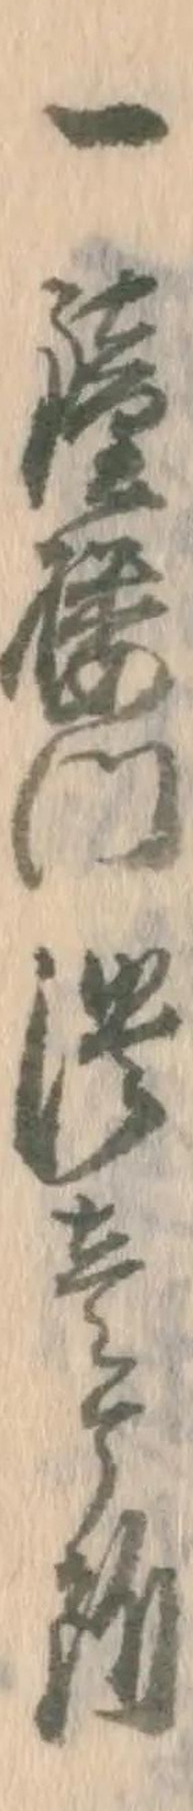一稲荷社潰壱ヶ所
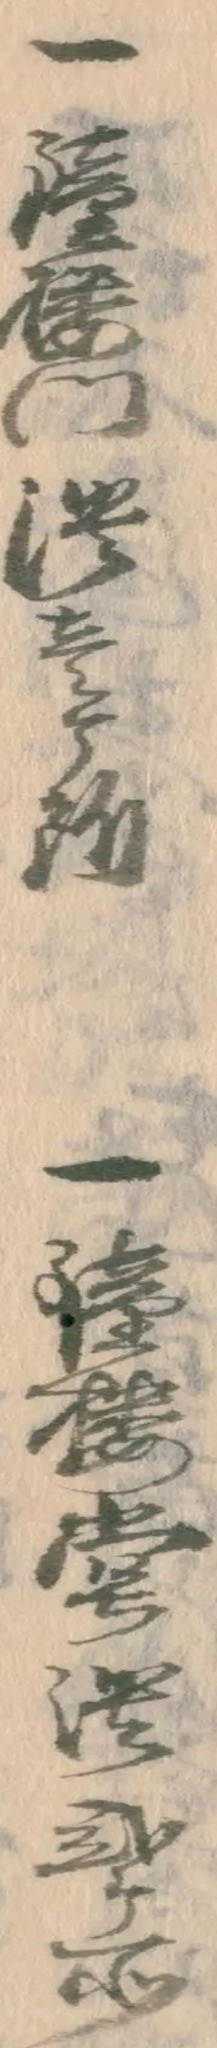一鐘楼門潰壱ヶ所一鐘楼堂潰弐ヶ所
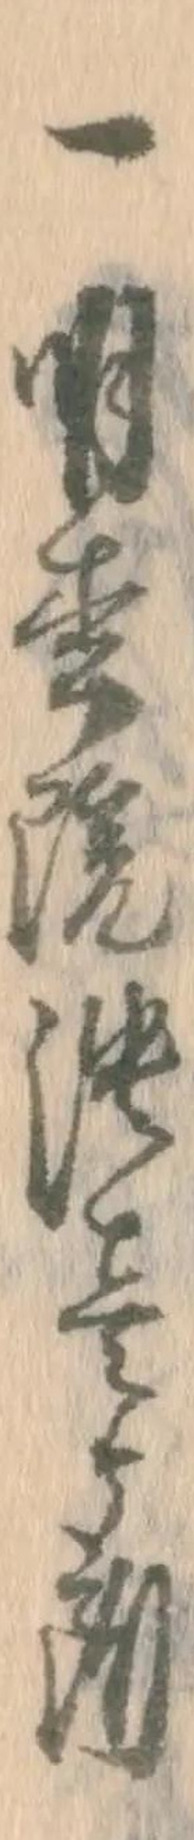一稲荷社潰壱ヶ所
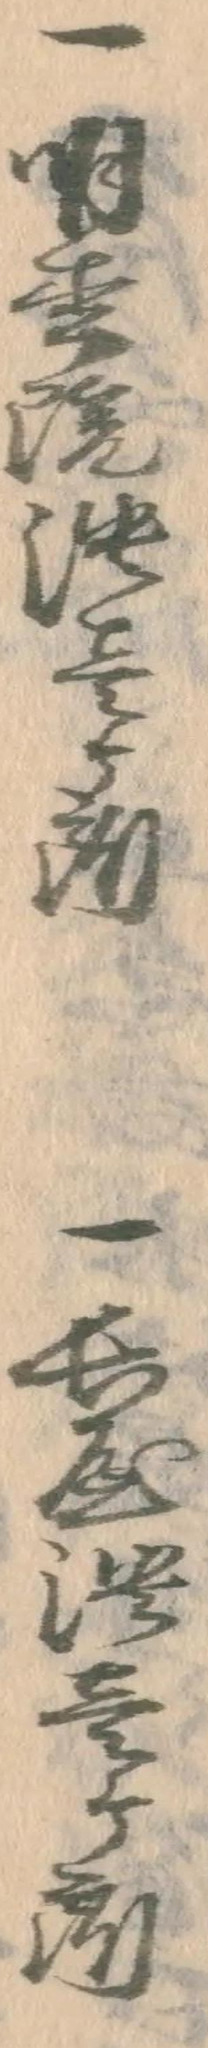一明松院潰壱ヶ所一長屋潰壱ヶ所
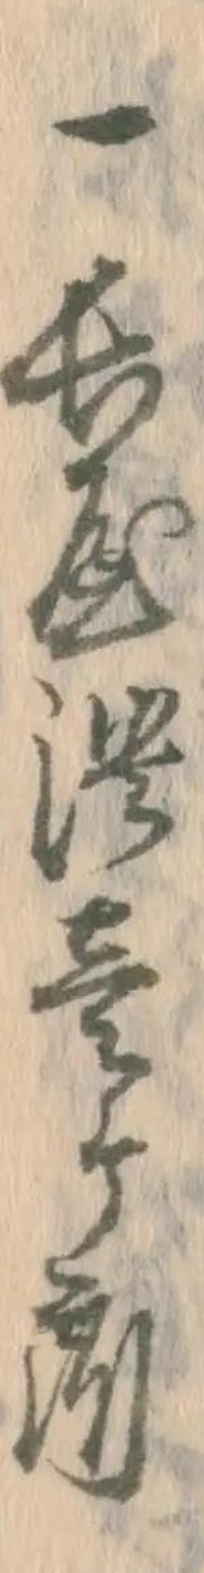一稲荷社潰壱ヶ所
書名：信州大地震之記
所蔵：国立国会図書館 National Diet Library, JAPAN
